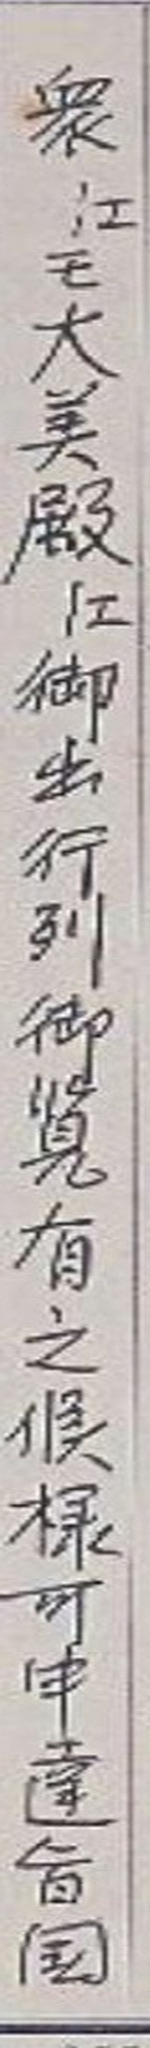衆えも大美殿え御出行列御覧有之候様可申達旨
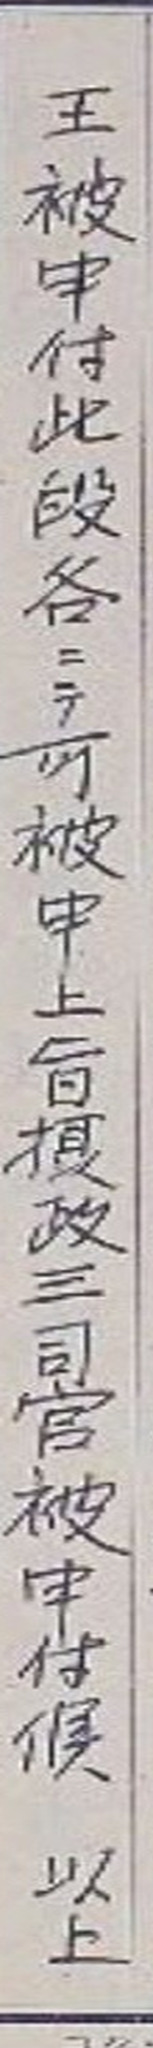王被申付此段各にて可被申上旨摂政三司官被申付候以上
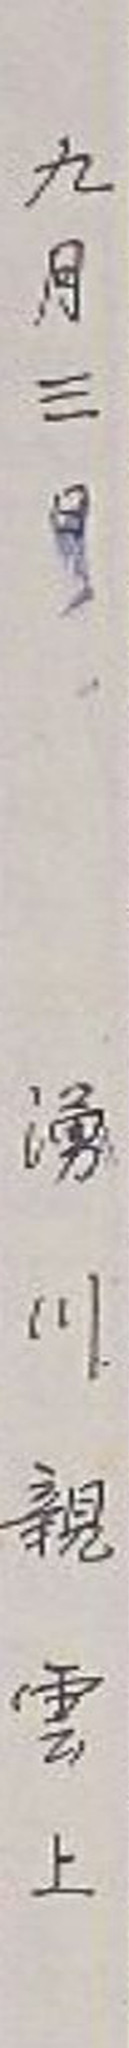九月三日湧川親雲上
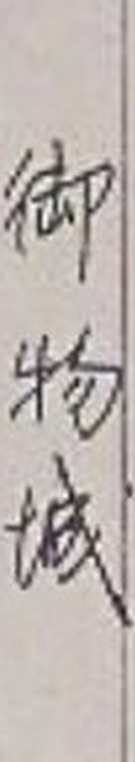御物城
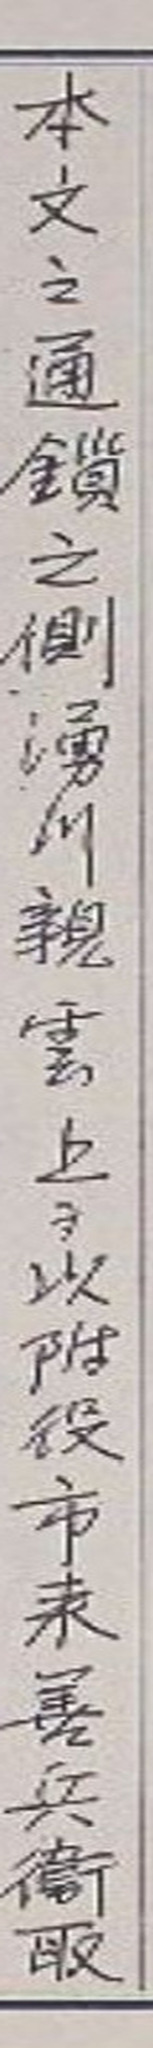本文之通鎖之側湧川親雲上を以附役市来善兵衛取
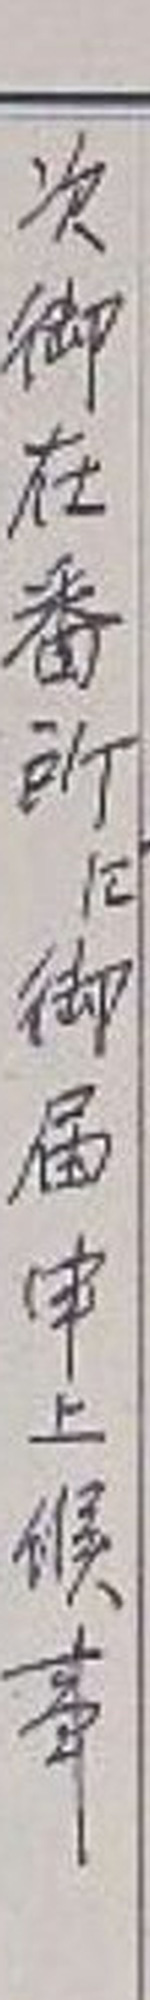次御在番所え御届申上候事
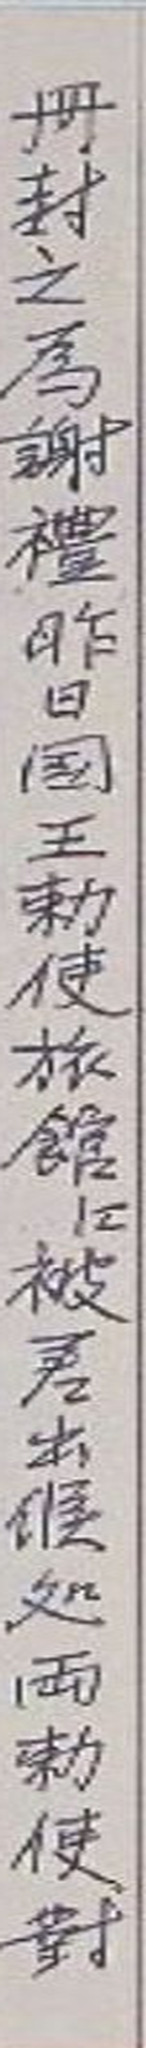冊封之為謝礼昨日国王勅使旅館え被差出候処両勅使対
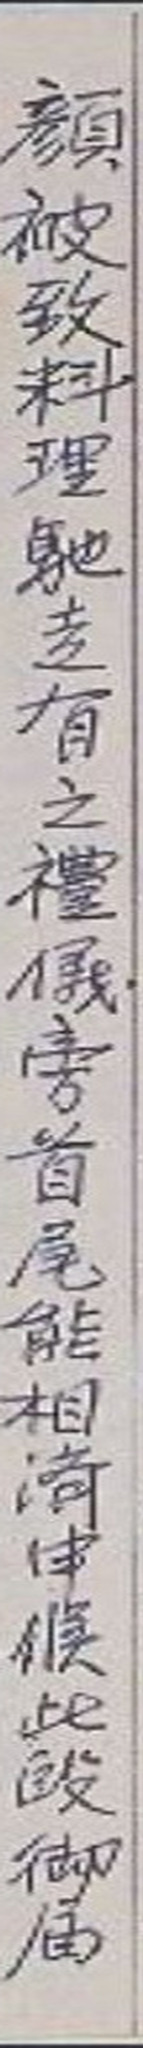顔被致料理馳走有之礼儀旁首尾能相済申候此段御届
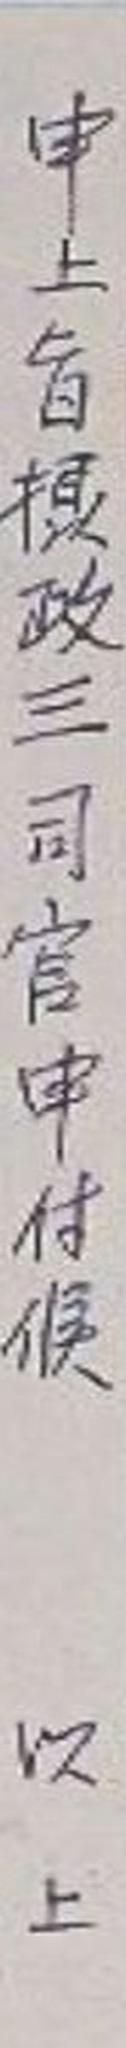申上旨摂政三司官申付候以上
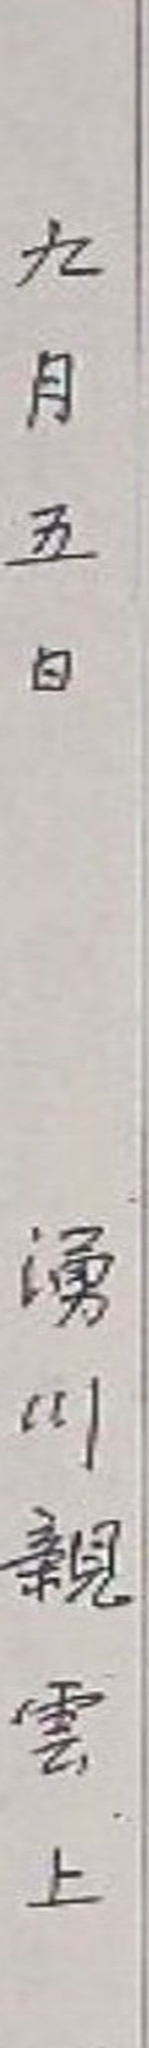九月五日湧川親雲上
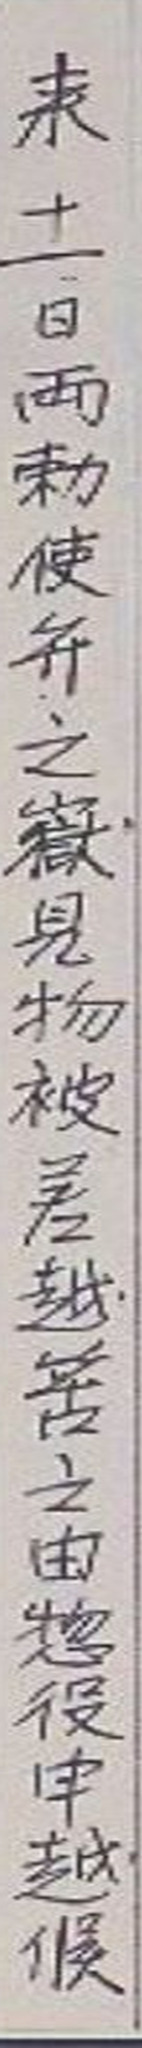来十一日両勅使弁之嶽見物被差越筈之由惣役申越候
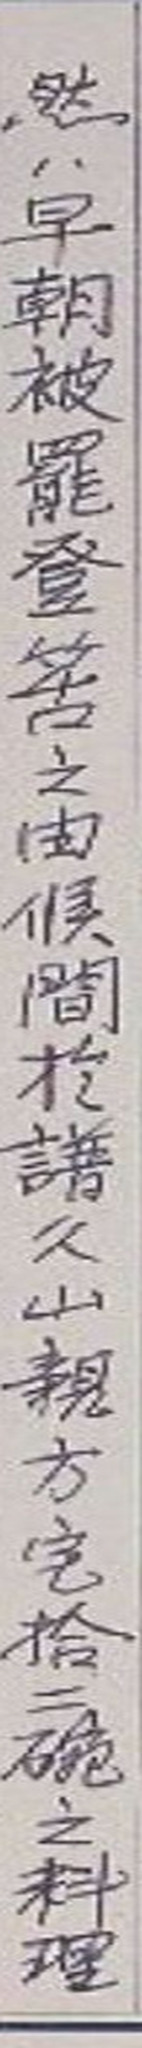然は早朝被罷登筈之由候間於譜久山親方宅拾二碗之料理
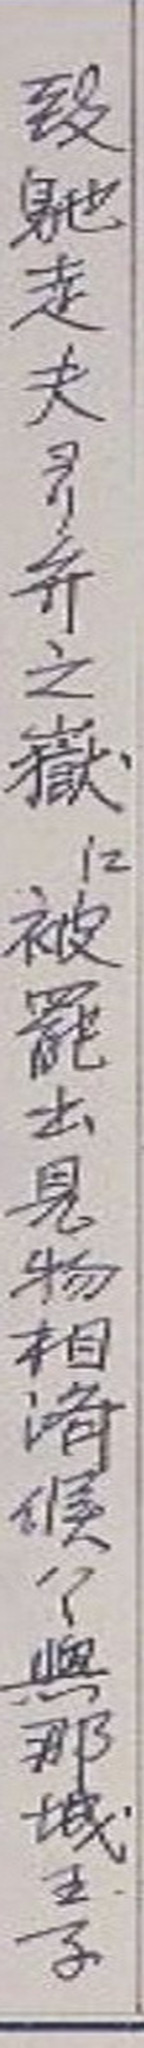致馳走夫より弁之嶽え被罷出見物相済候はゝ与那城王子
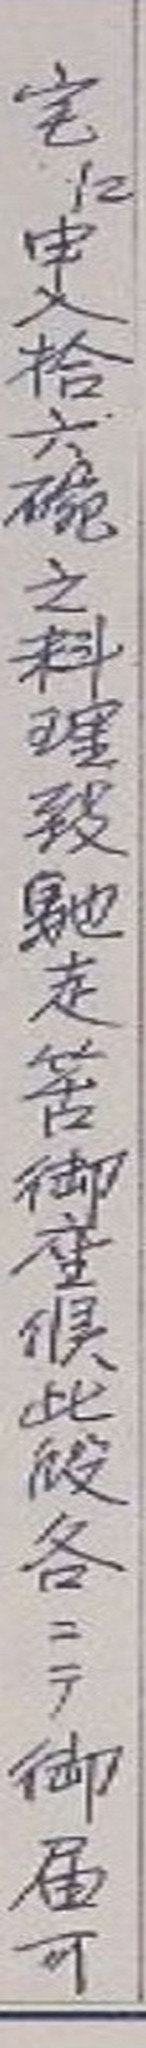宅え申入拾六碗之料理致馳走筈御座候此段各にて御届可

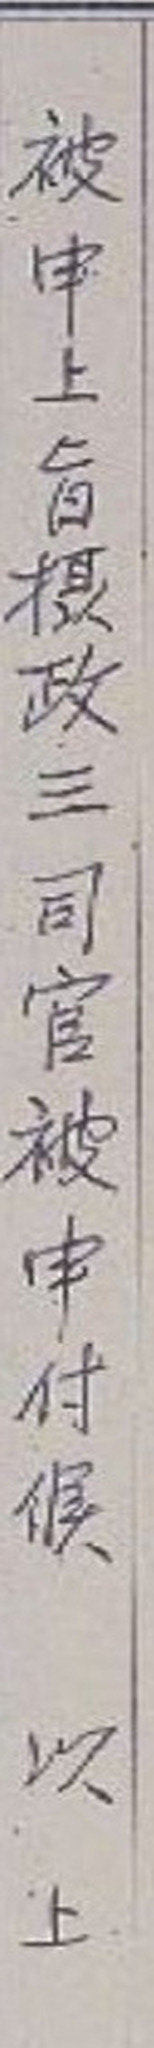被申上旨摂政三司官被申付候以上
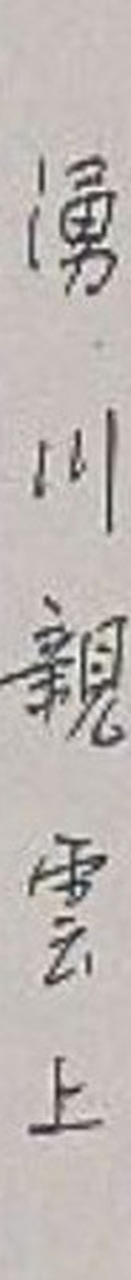湧川親雲上
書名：支那冊封使来琉諸記 下巻
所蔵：University of the Ryukyus Library
